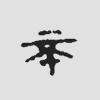不
